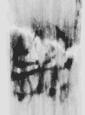與
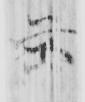不
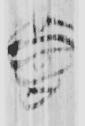善
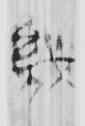幾
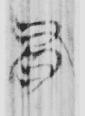有
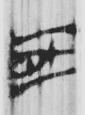亙
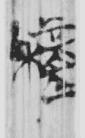穜
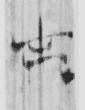才
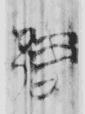唯
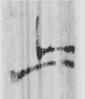上
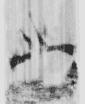之
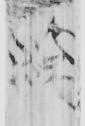流
